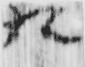九
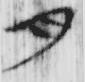月
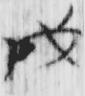戊
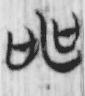申
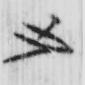之
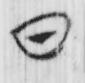日
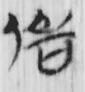俈
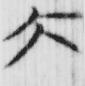大
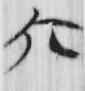六
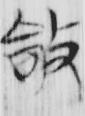○（令）
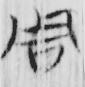周
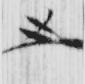之
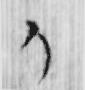人
